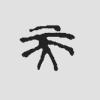天
